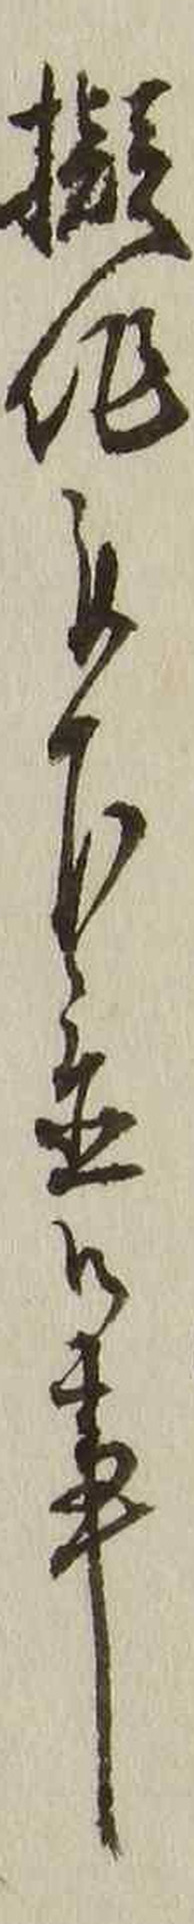擬作被下置候事
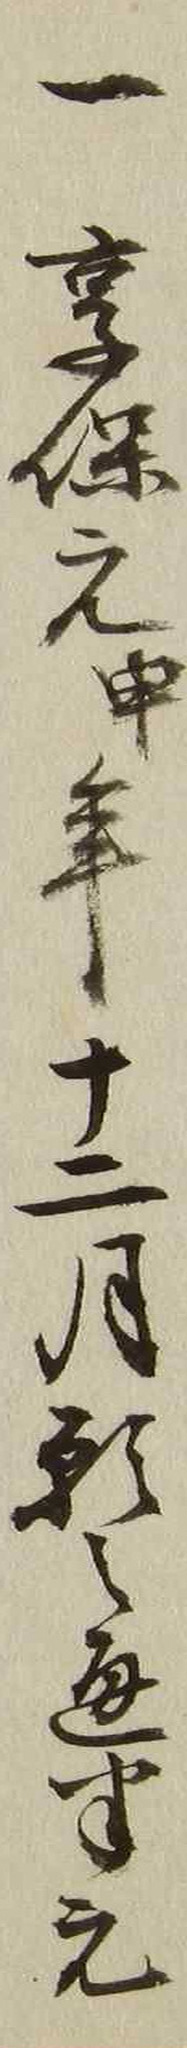一享保元申年十二月願之通半元
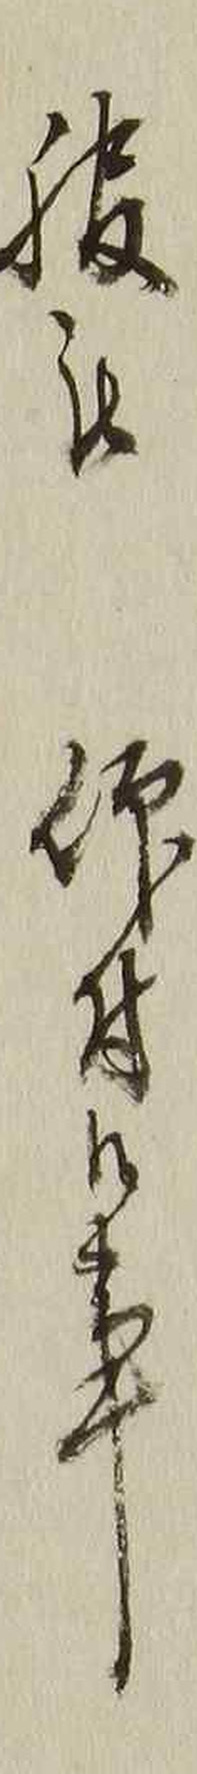服被仰付候事
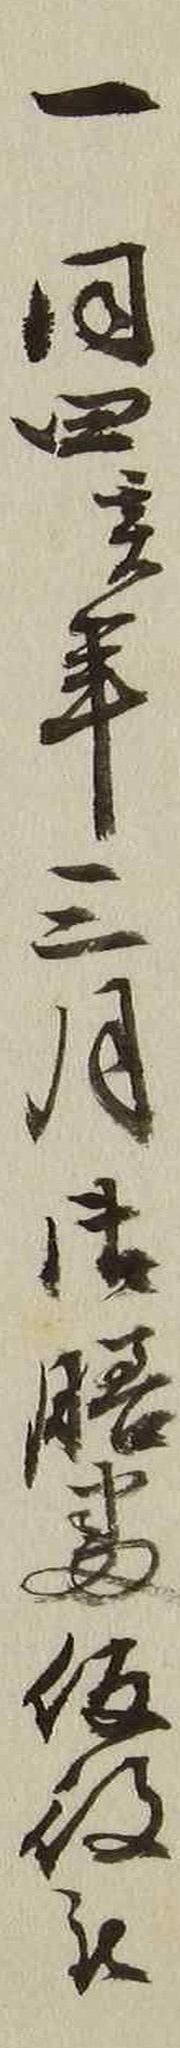一同四亥年三月御膳番仮役被
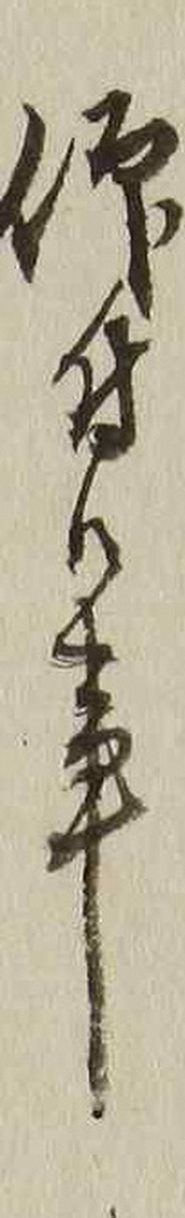仰付候事
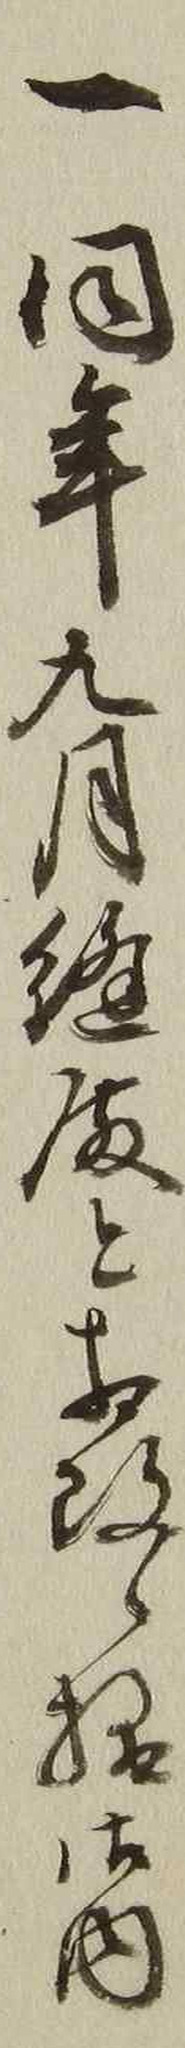一同年九月縫殿と相改候様御内
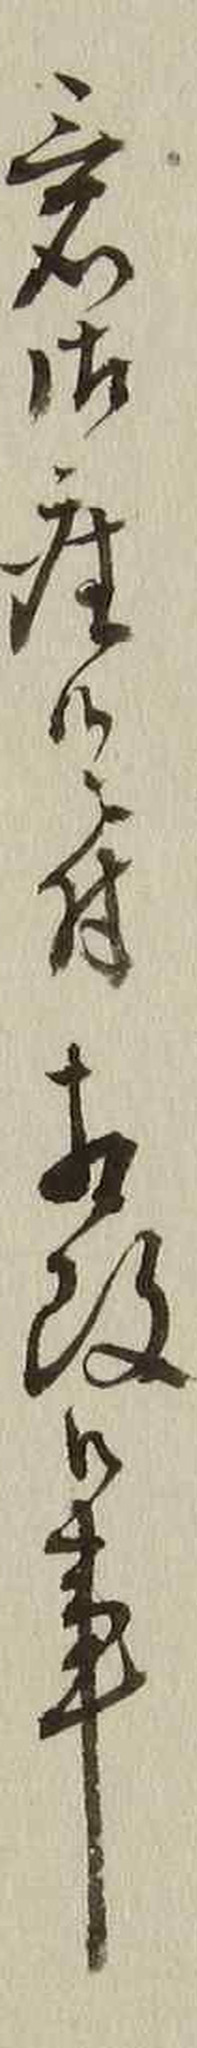意御座候ニ付相改候事
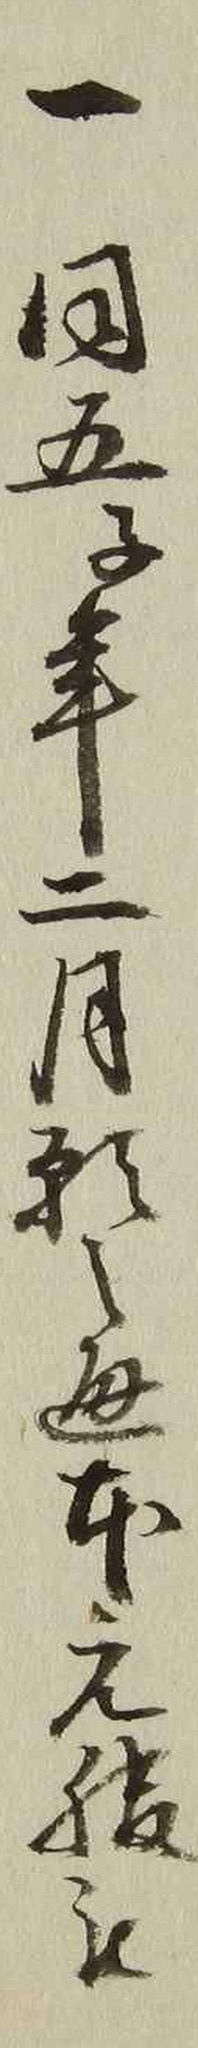一同五子年二月願之通本元服被
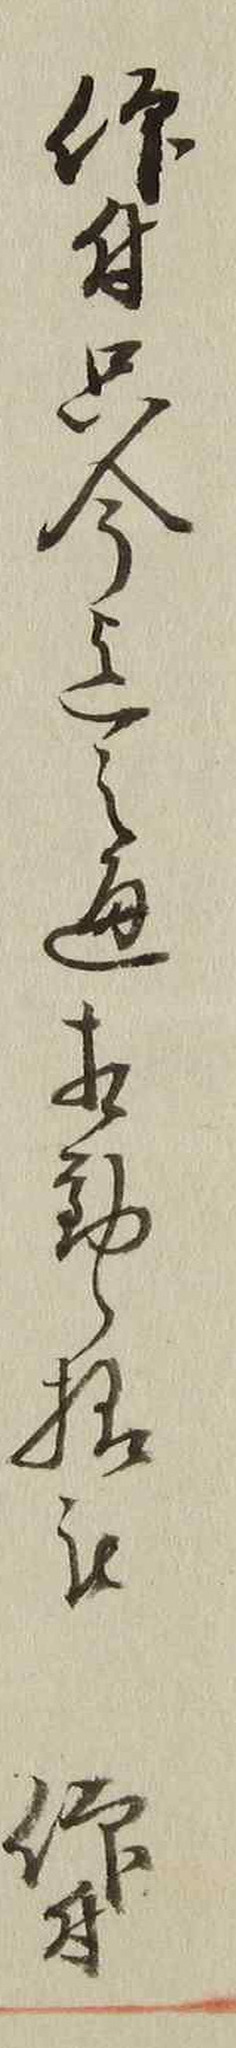仰付只今迄之通相勤候様被仰付
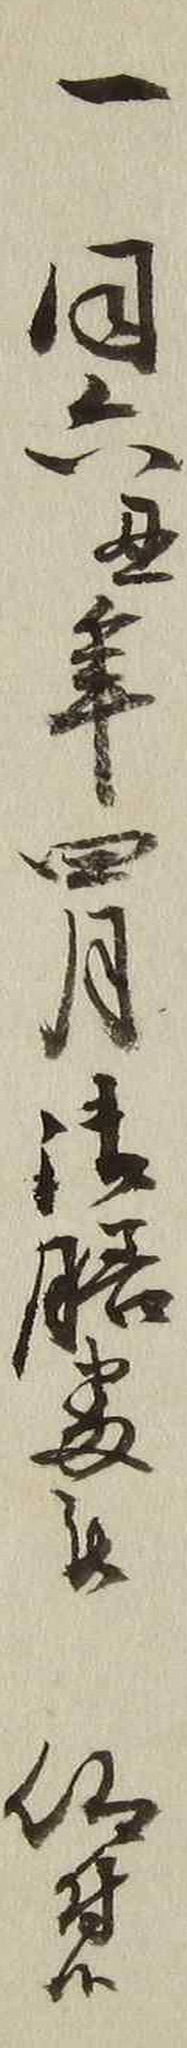一同六丑年四月御膳番被仰付候
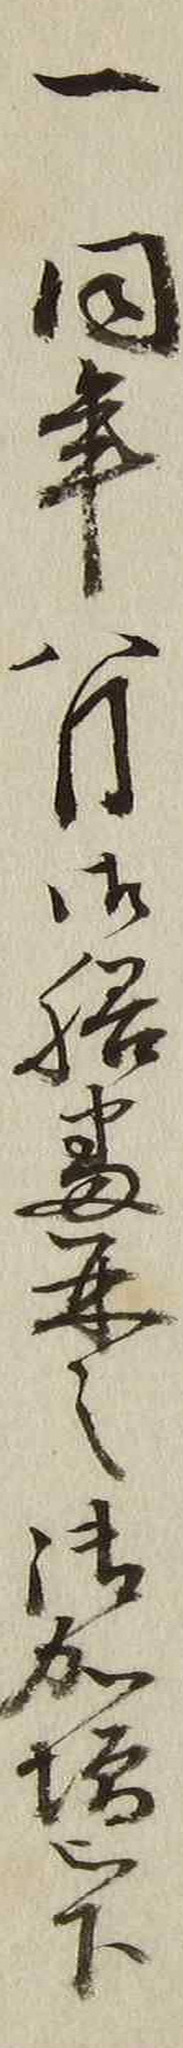一同年八月御膳番并之御加増被下
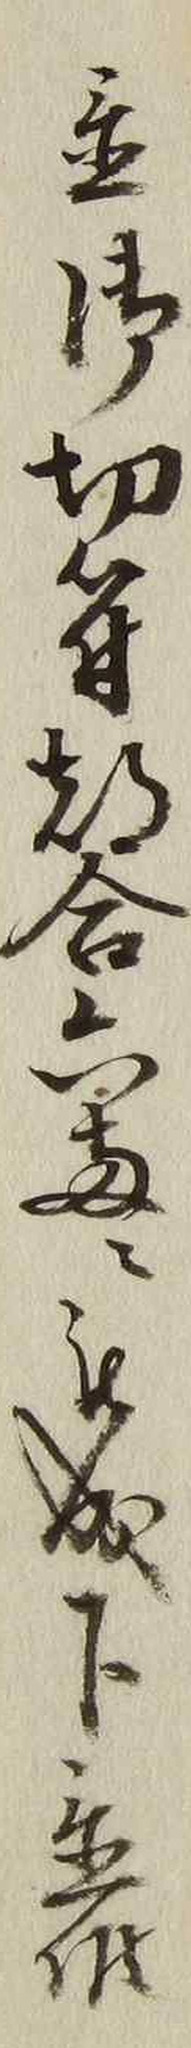置御切符都合六両ニ被成下置候
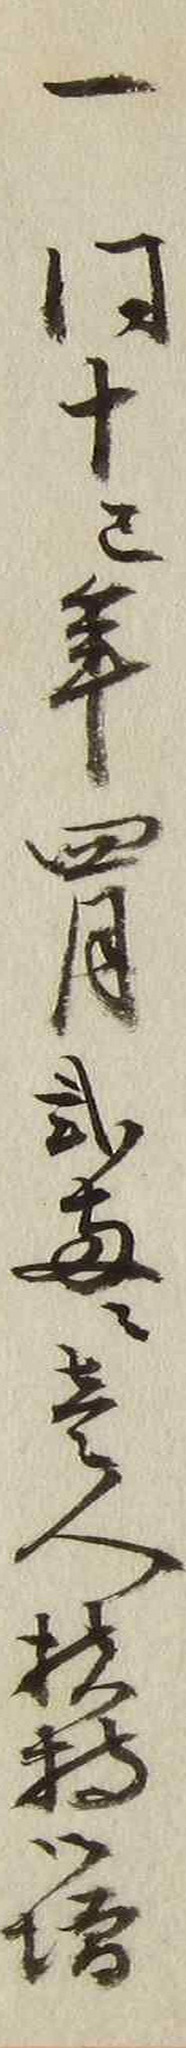一同十巳年四月弐両ニ壱人扶持御増
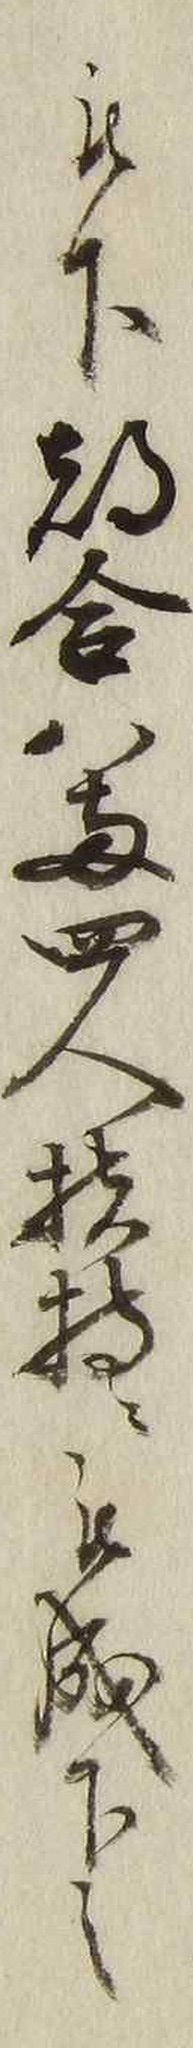被下都合八両四人扶持ニ被成下之
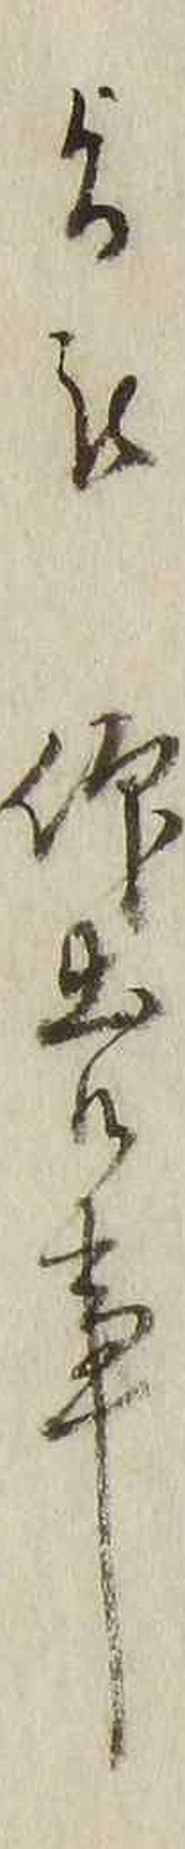旨被仰出候事
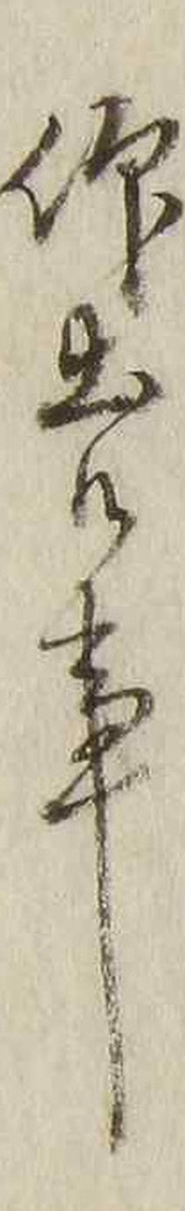仰付候事
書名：諸士系譜　巻之23　い之部23
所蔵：会津若松市立会津図書館
